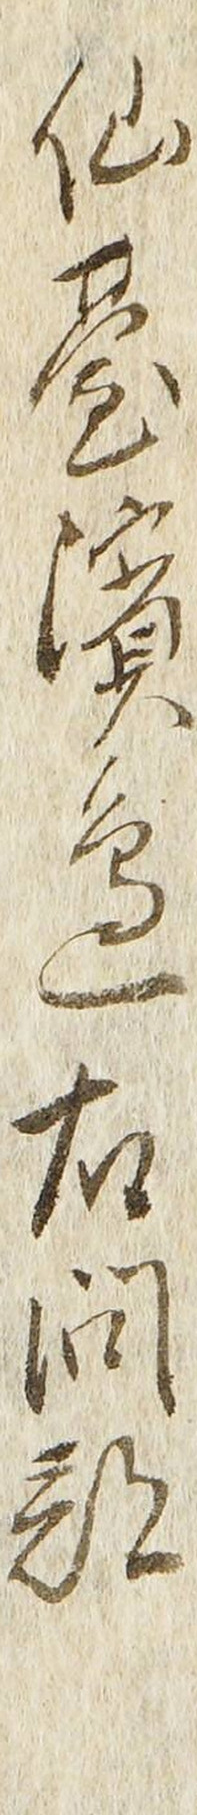仙台浜辺右問部
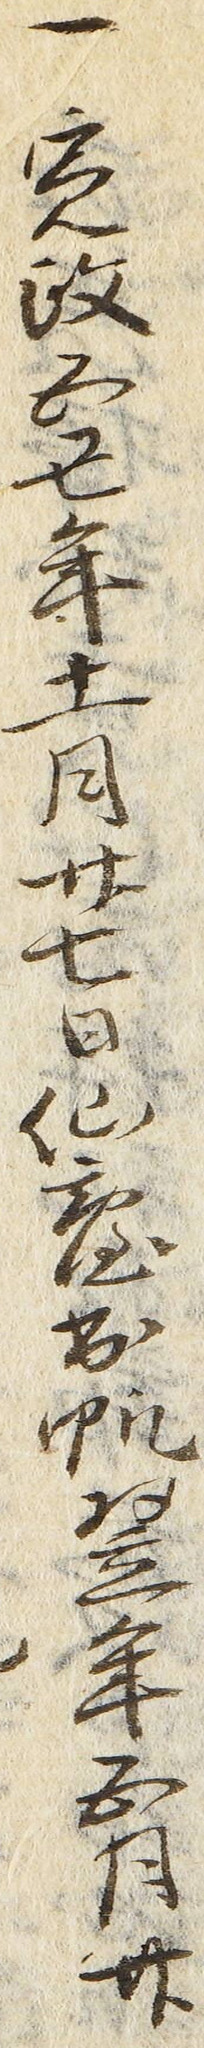一寛政五丑年十一月廿七日仙台出帆翌年五月廿
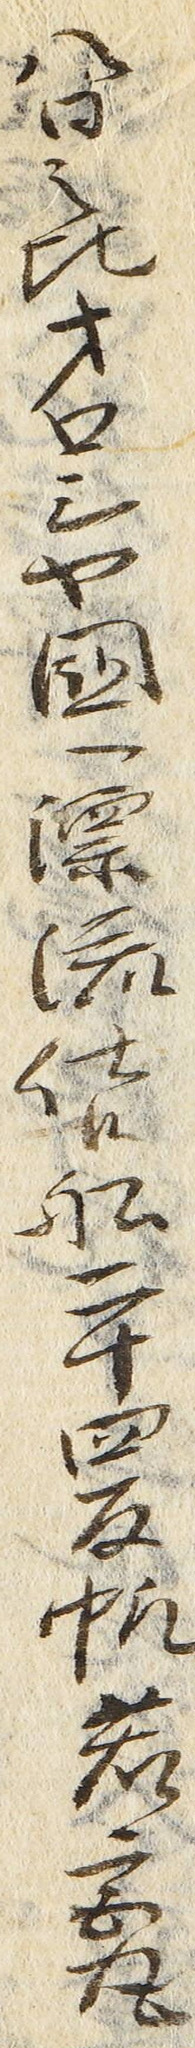八日之頃オロシヤ国へ漂流仕候船二十四反帆若宮丸
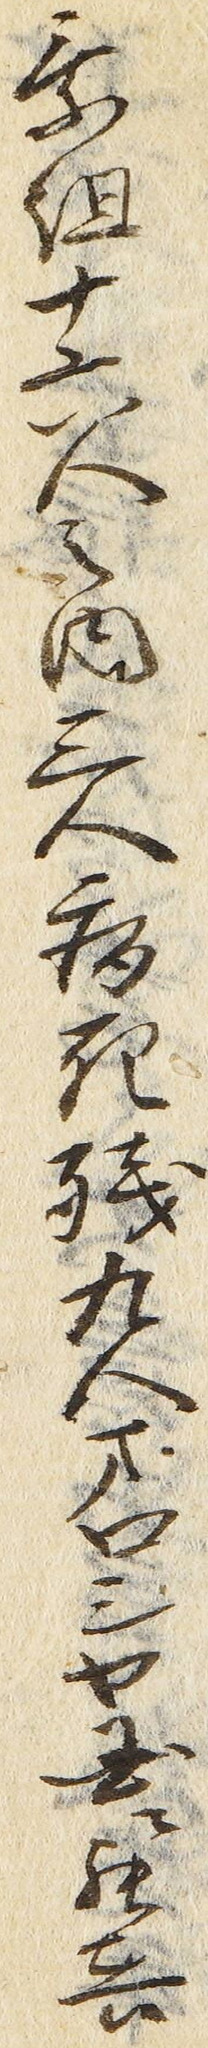乗組十六人之内三人病死残九人オロシヤ国に罷在候
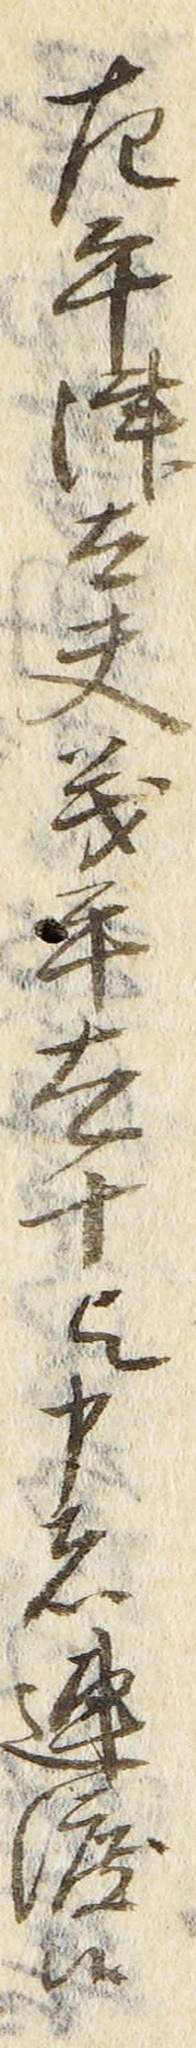左平津太夫義平太十と申者連渡候
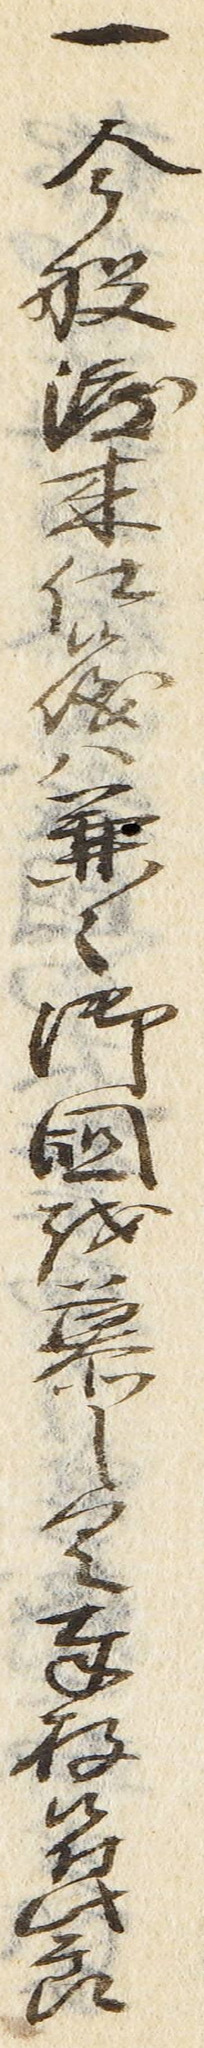一今般渡来仕候儀は兼々御国を慕しく奉存候付此節
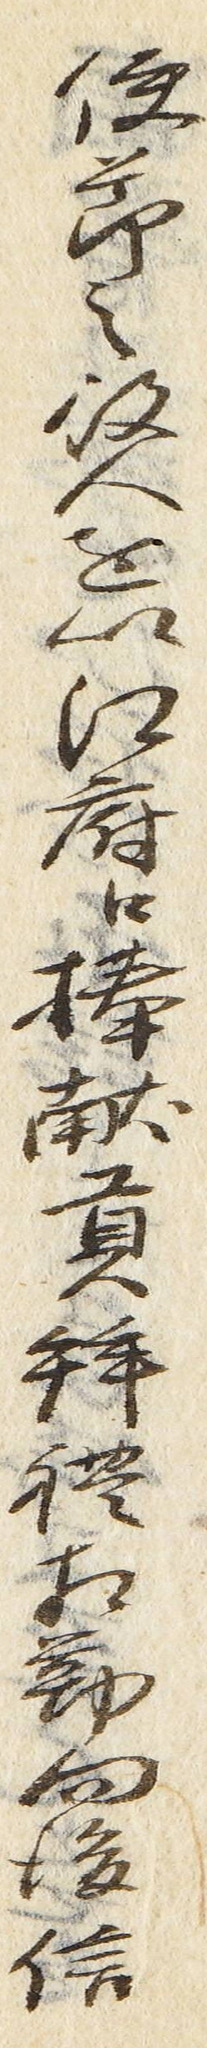使節之役人を以江府え捧献貢拝礼相勤向後信
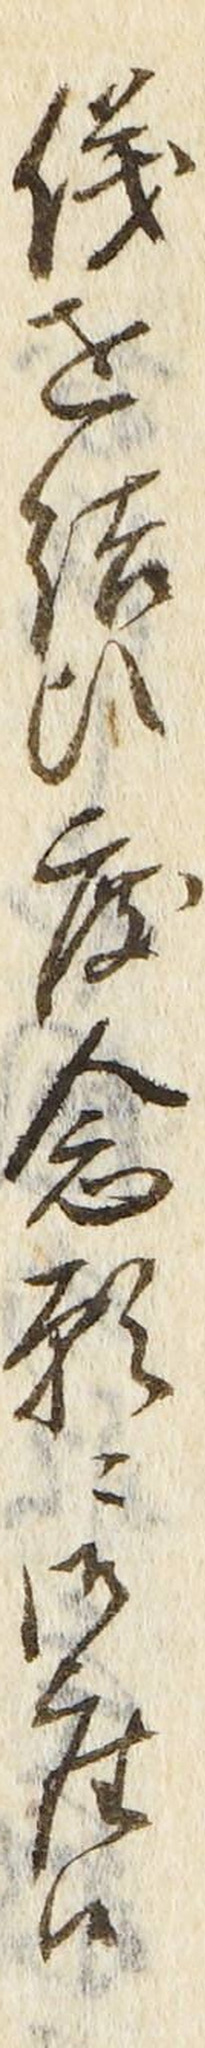儀を結ひ度念願に御座候
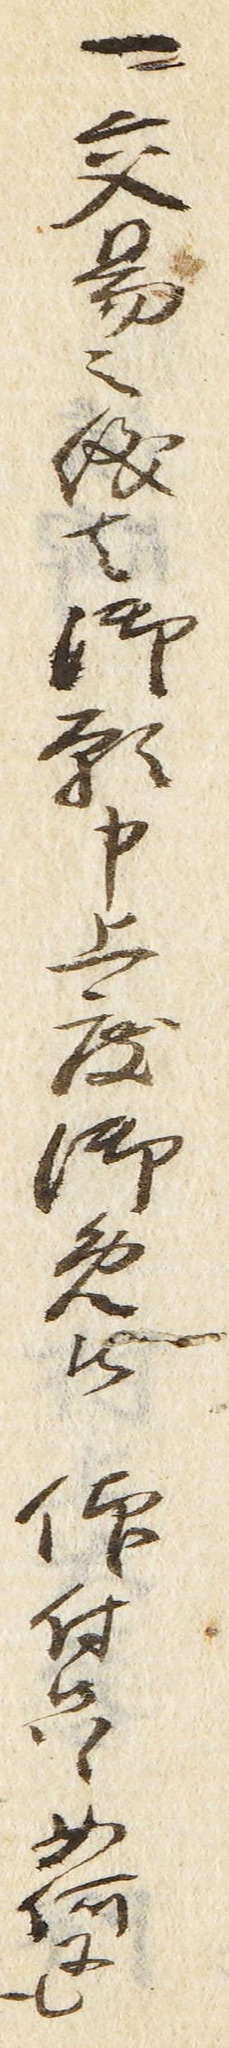一交易之儀は御願申上度御免被仰付候はゝ如何にも
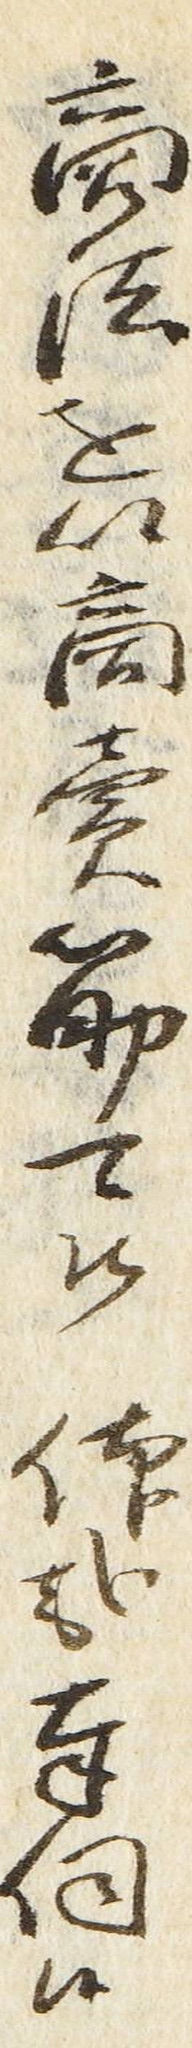商法を以商売筋可被仰哉奉伺候
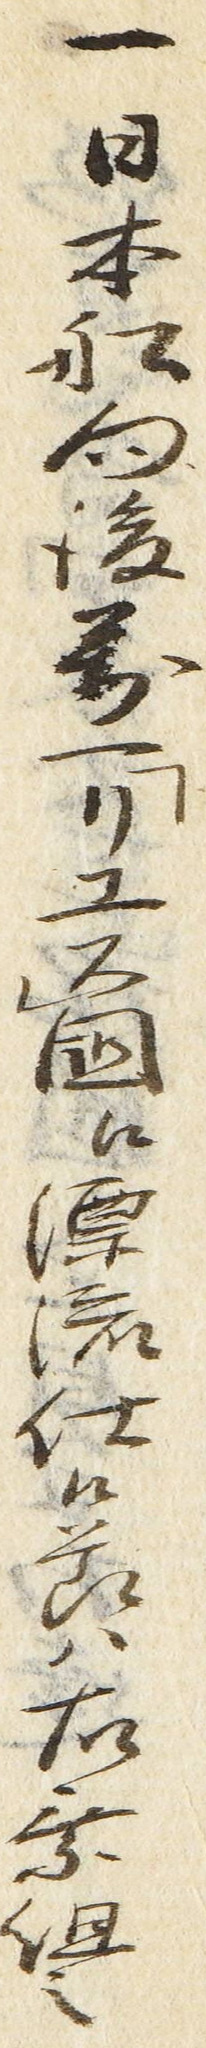一日本船向後万一「リユス」国え漂流仕候節は右乗組之
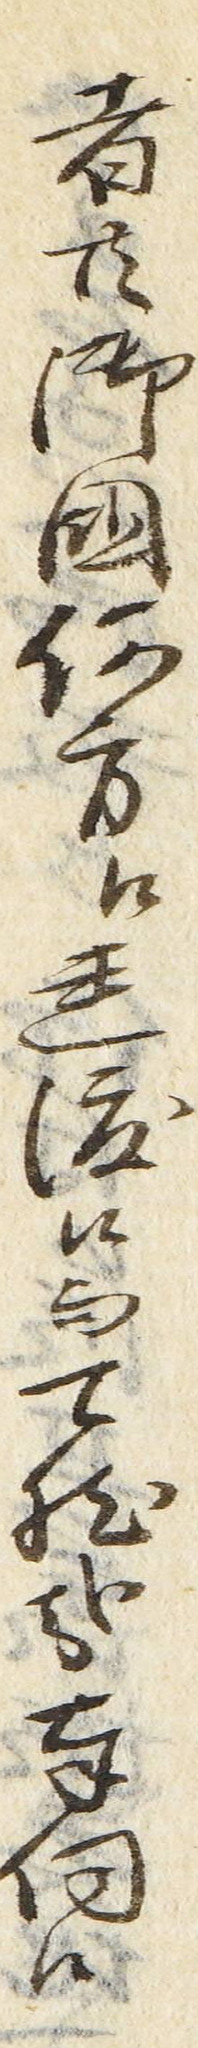者共御国何方え連渡候て可然哉奉伺候
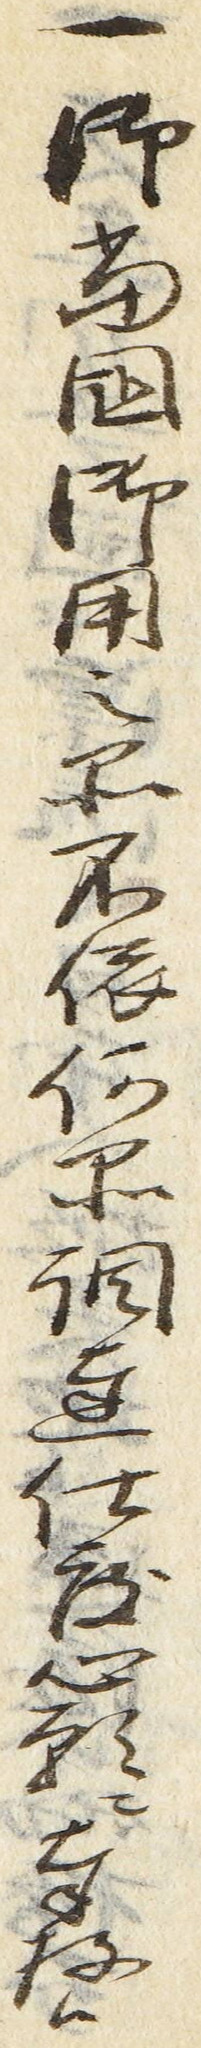一御当国御用之品不依何品調達仕度心願に奉存候
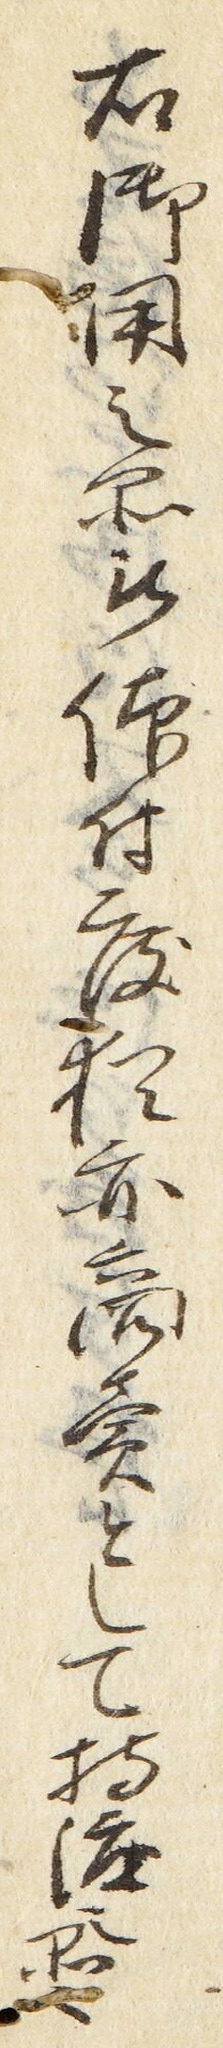右御用之品被仰付度猶亦商売として持渡之品々

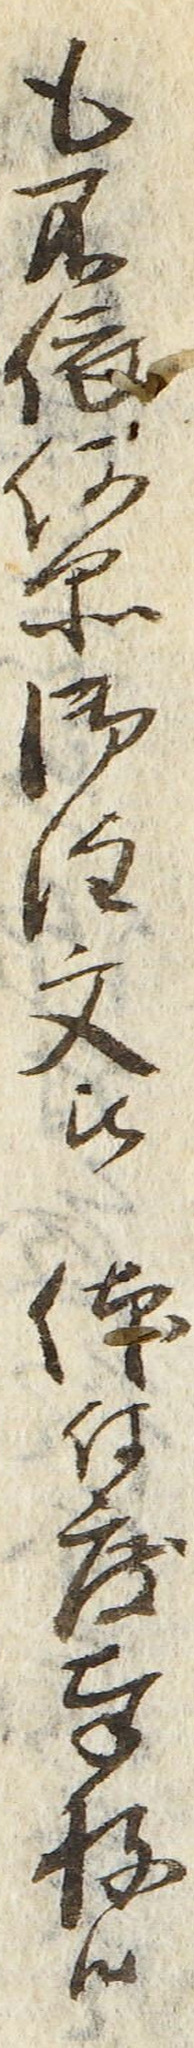も不依何品御注文被仰付度奉存候
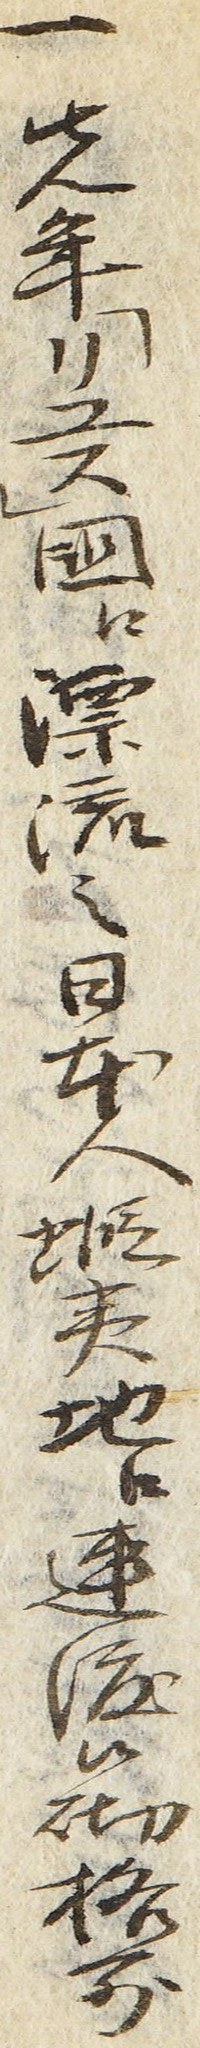一先年「リユス」国え漂流之日本人蝦夷地え連渡候砌格別
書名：漂民後記
